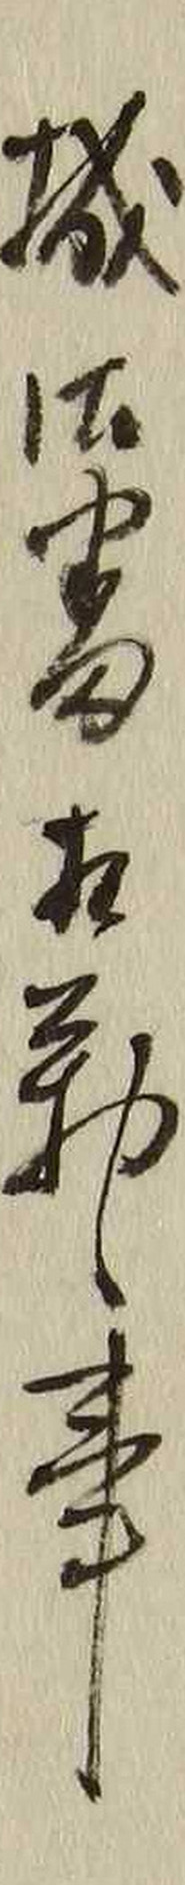城御番相勤候事
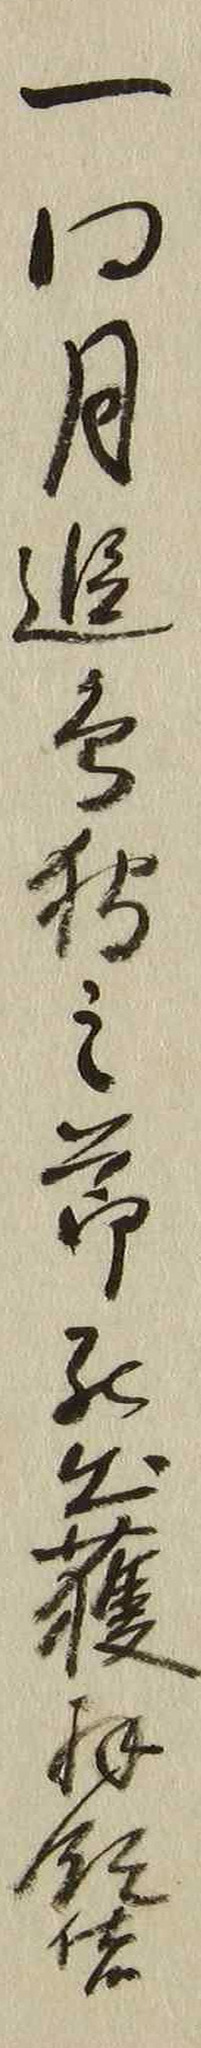一同月追鳥狩之節罷出獲拝領仕候
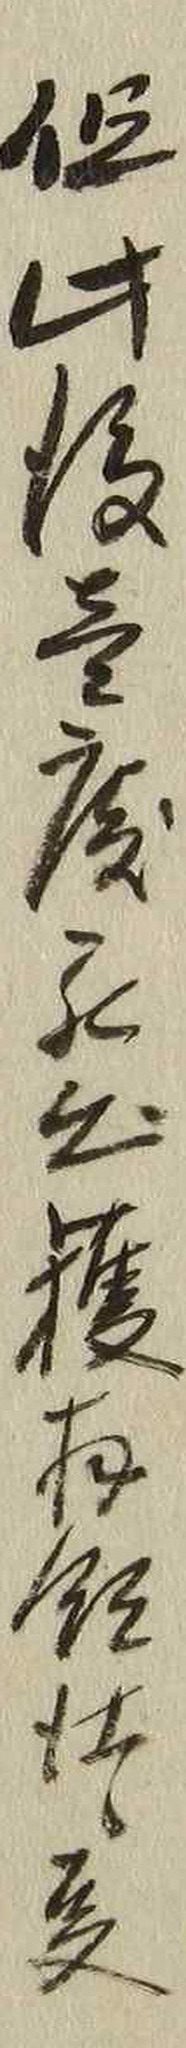但此後壱度罷出獲拝領仕候事
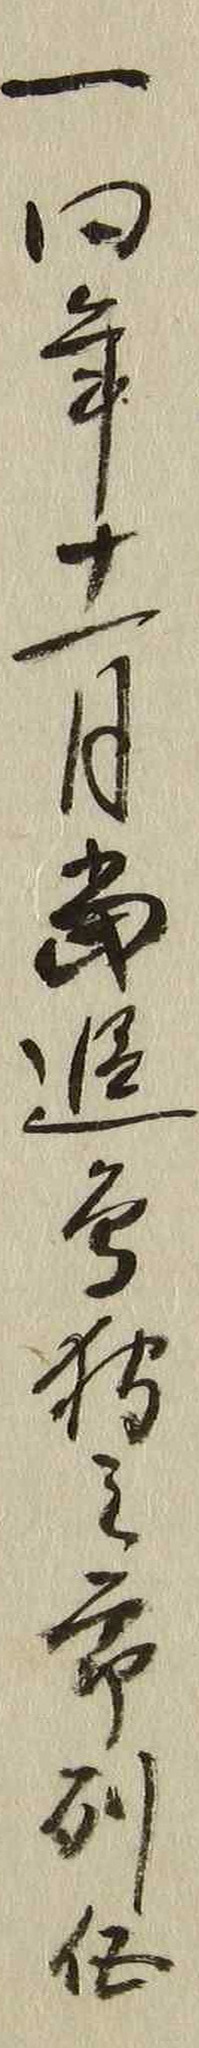一同年十一月当追鳥狩之節列伍
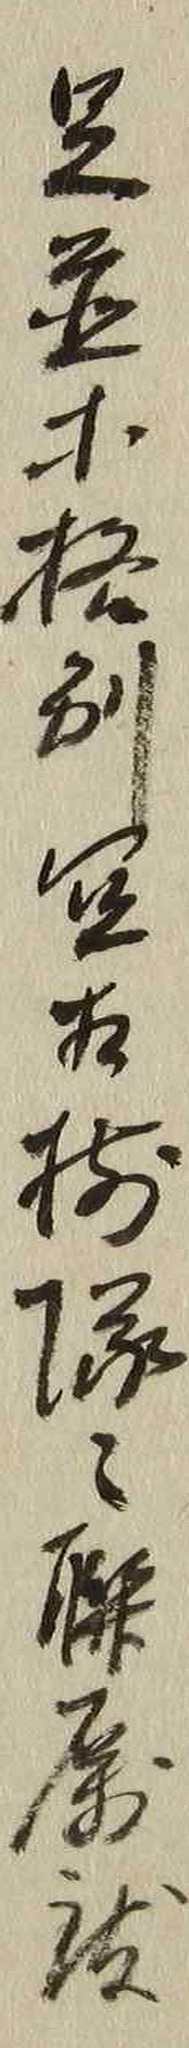足並等格別宜相揃隊々聯属致
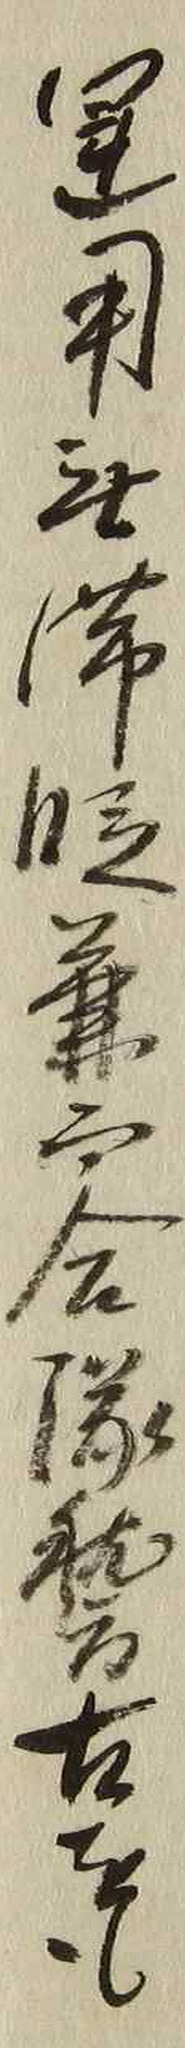運用無滞段兼而合隊稽古をも
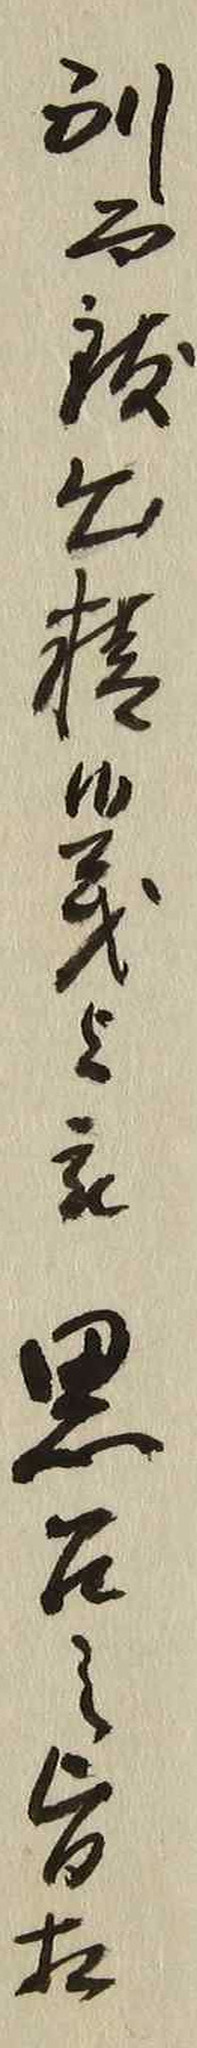別而致出精候義与被思召之旨相
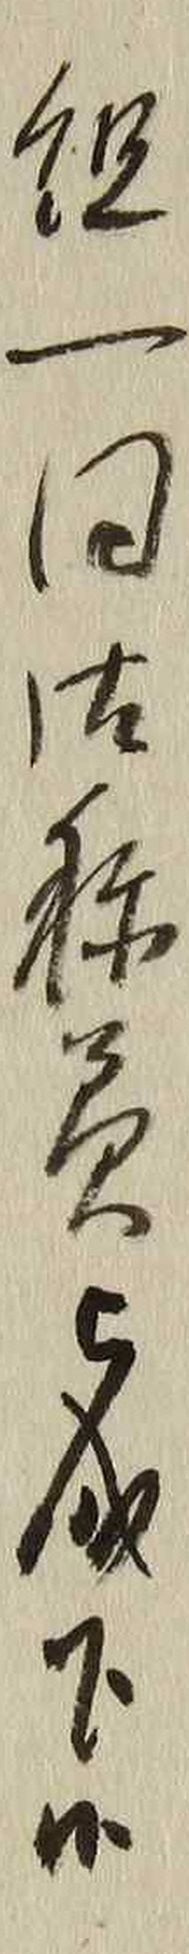組一同御称美被成下候
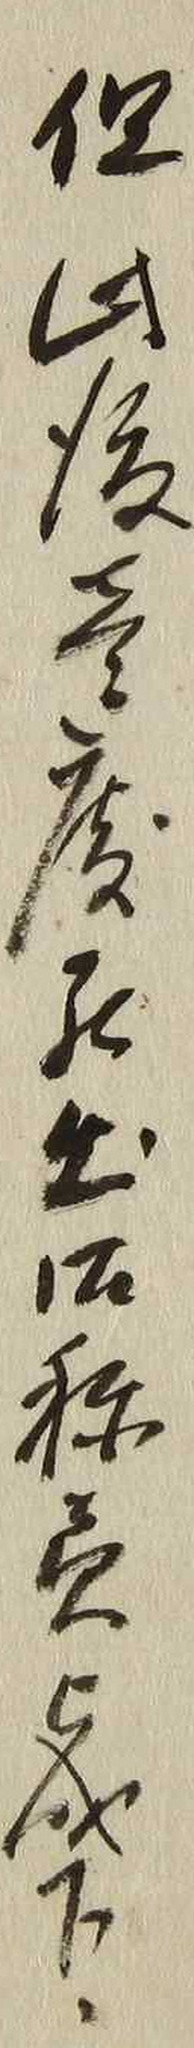但此後壱度罷出御称美被成下候
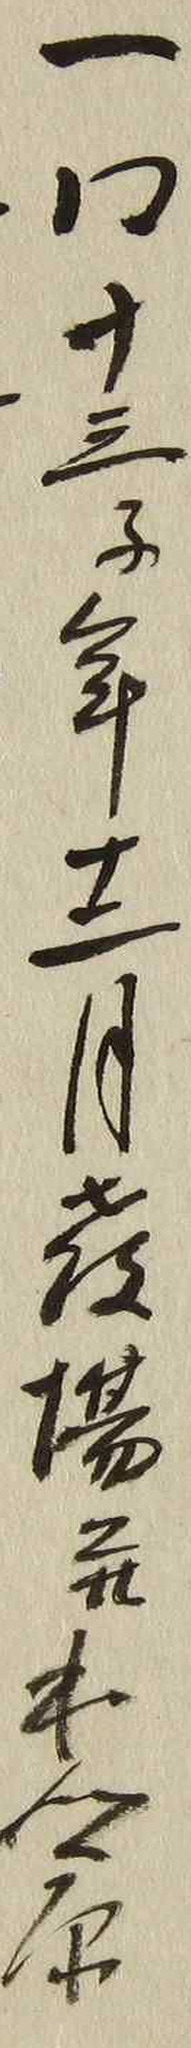一同十三子年十二月教場并本郷原
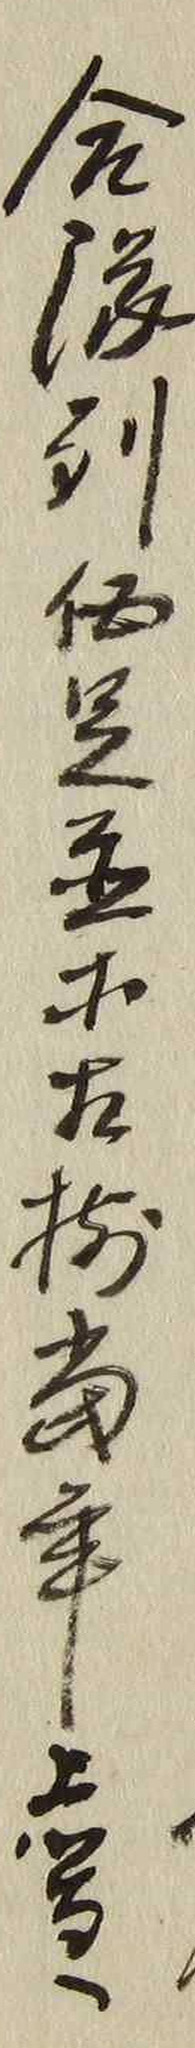合隊列伍足並等相揃当年上等へ
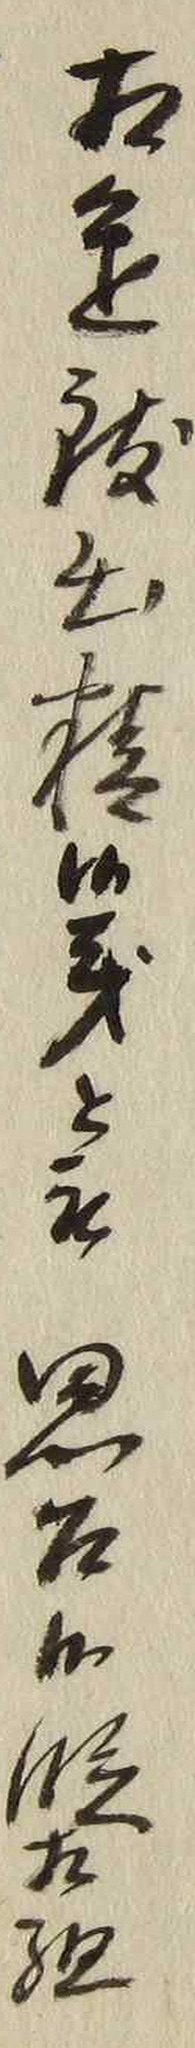相進致出精候義と被思召候段相組
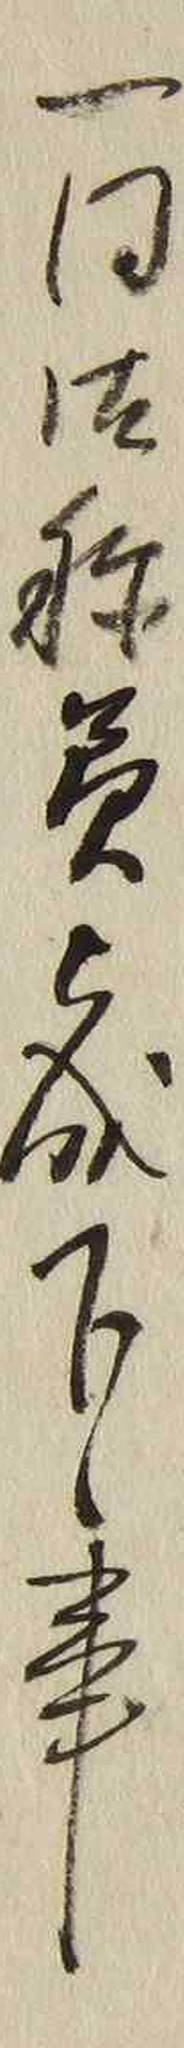一同御称美被成下候事
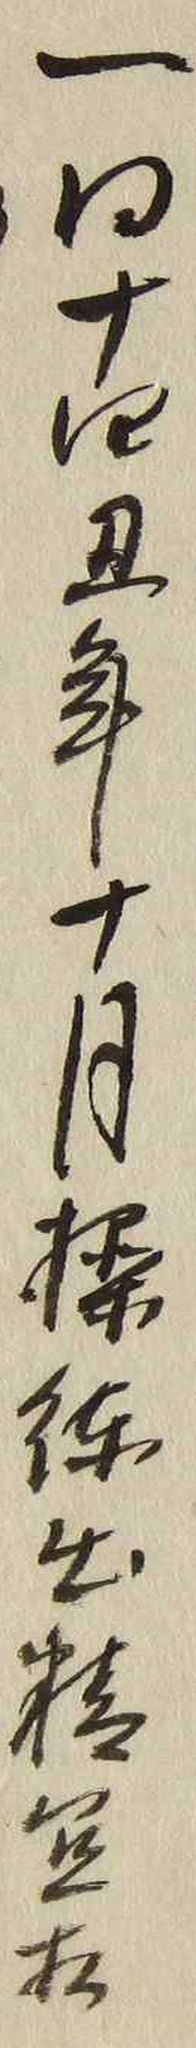一同十四丑年十月操練出精宜相
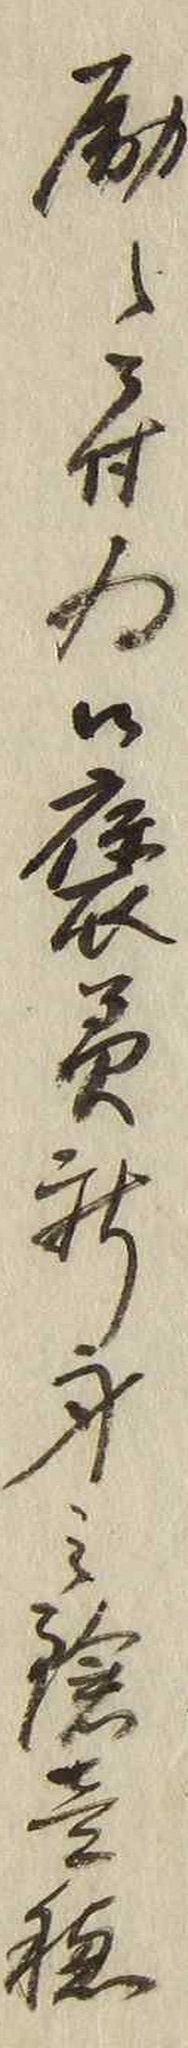励候ニ付為御褒美新身之鎗壱穂

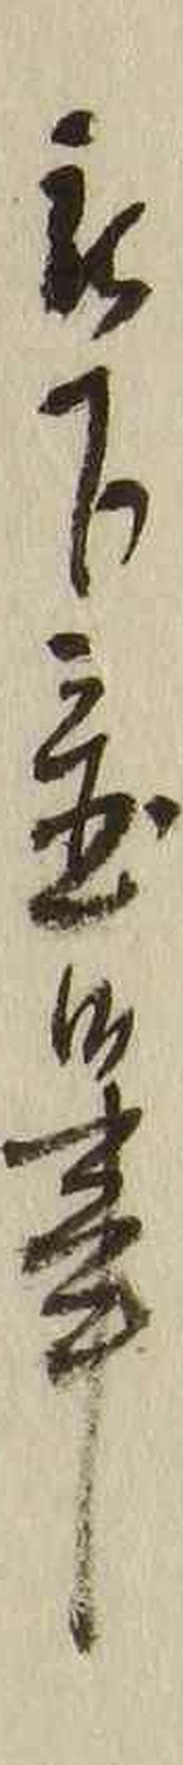被下置候事
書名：諸士系譜　巻之359　す之部9
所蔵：会津若松市立会津図書館
